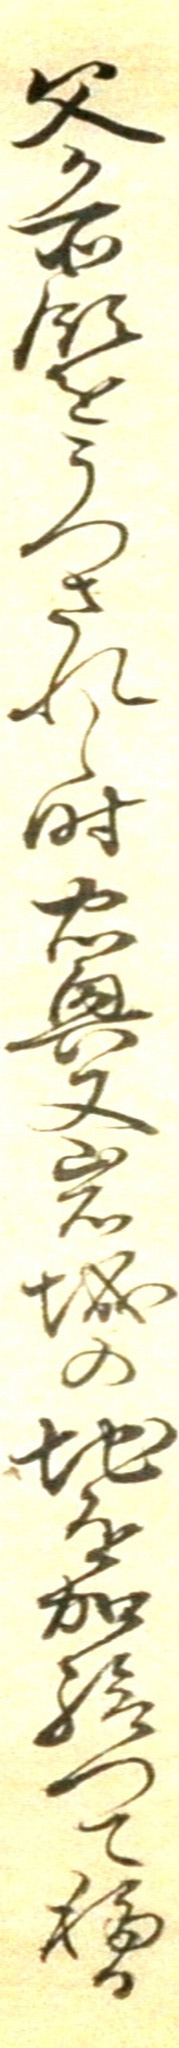父か所領をうつされし時忠興又岩城の地を加給つて移る
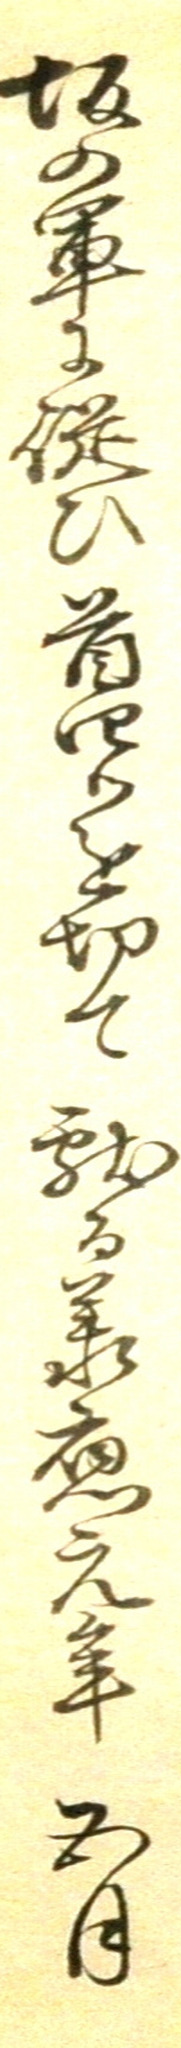坂の軍に従ひ首四ツを切て献る承応元年五月
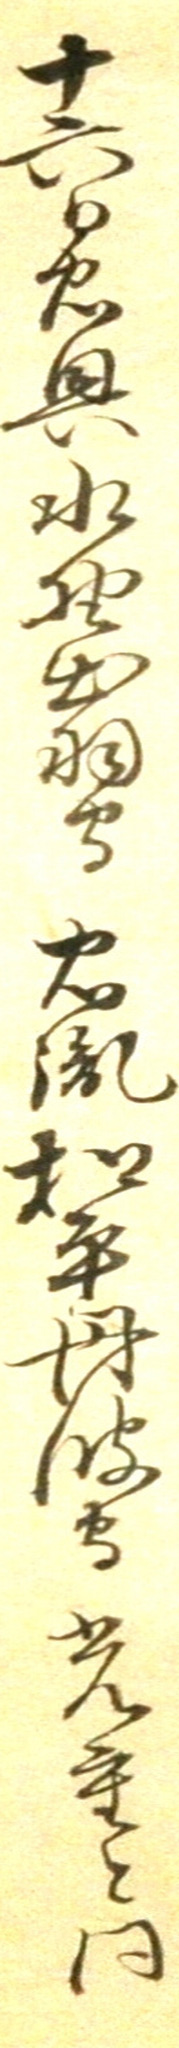十六日忠興水野出羽守忠胤松平丹波守光重と同
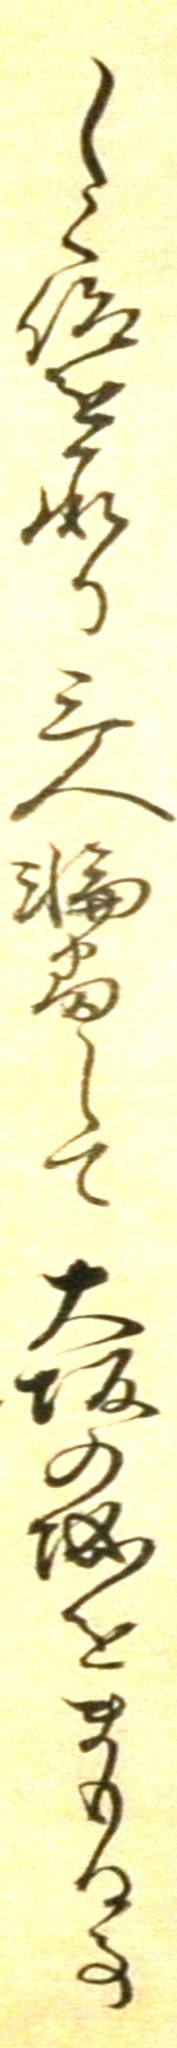しく仰を承り三人輪番して大坂の城をまもる事

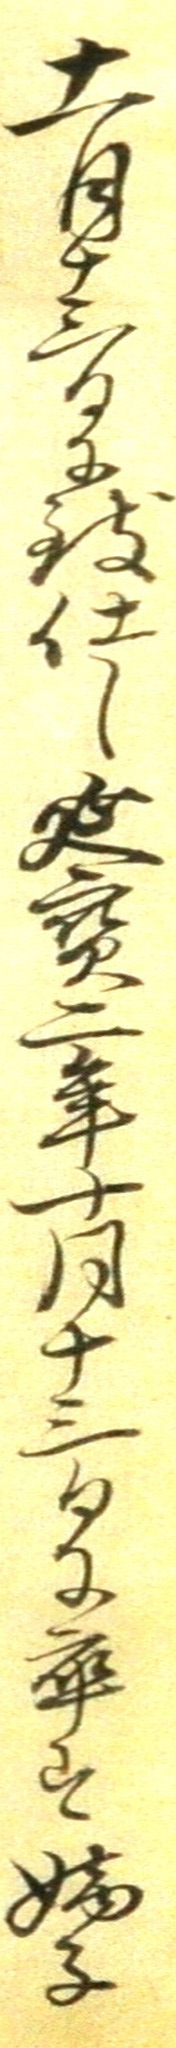十一月十三日に致仕し延宝二年十月十三日に卒す嫡子
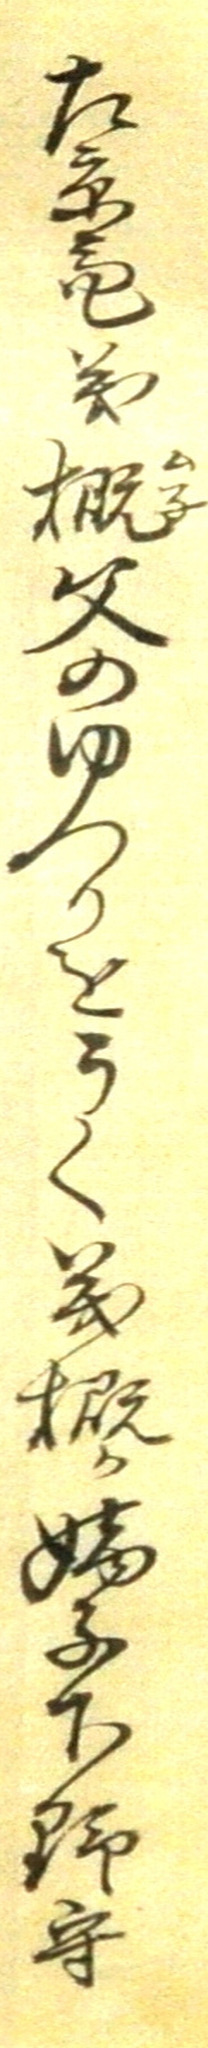左京亮義概父のゆつりをうく義概か嫡子下野守
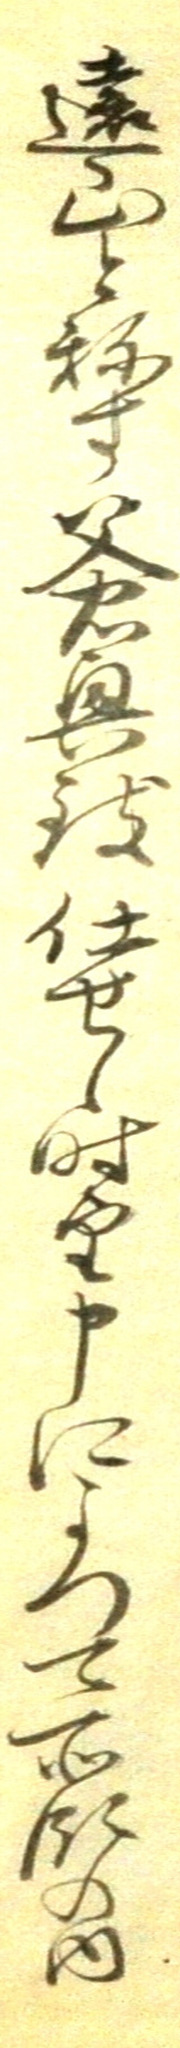遠山と称す父忠興致仕せし時望申によつて所領の内
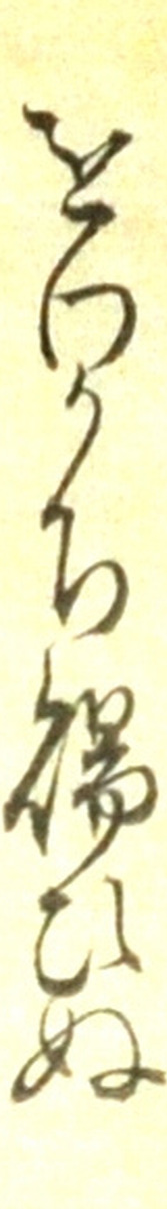をわかち賜ひぬ
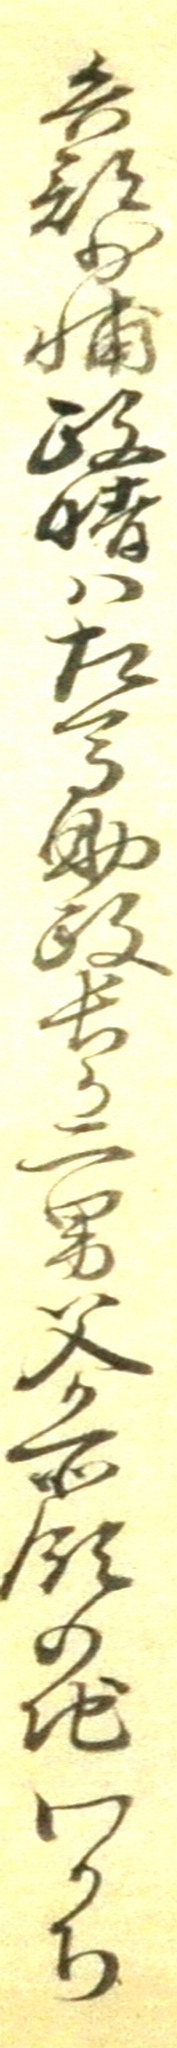兵部少輔政晴は左馬助政長か二男父か所領の地わかち
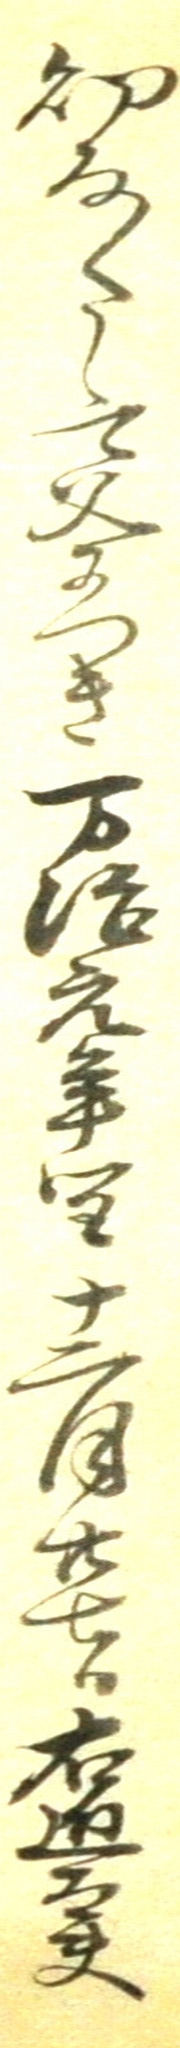幼なくして父につき万治元年閏十二月廿七日右近太夫
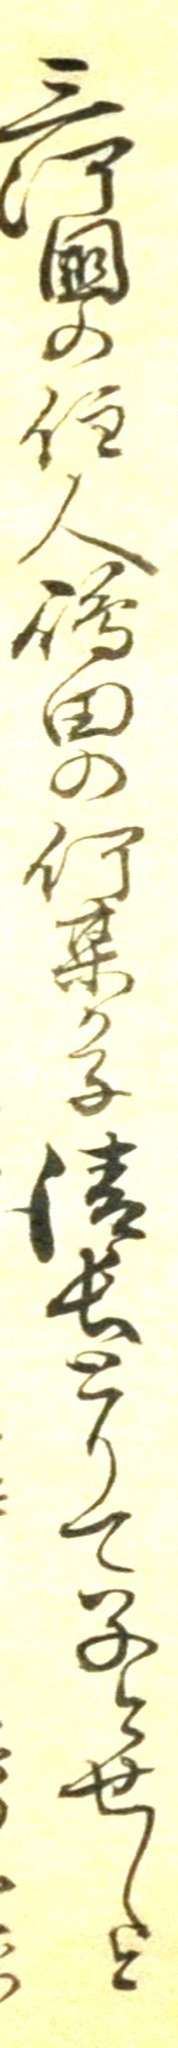三河国の住人嶋田の何某か子清長とりて子とせしと
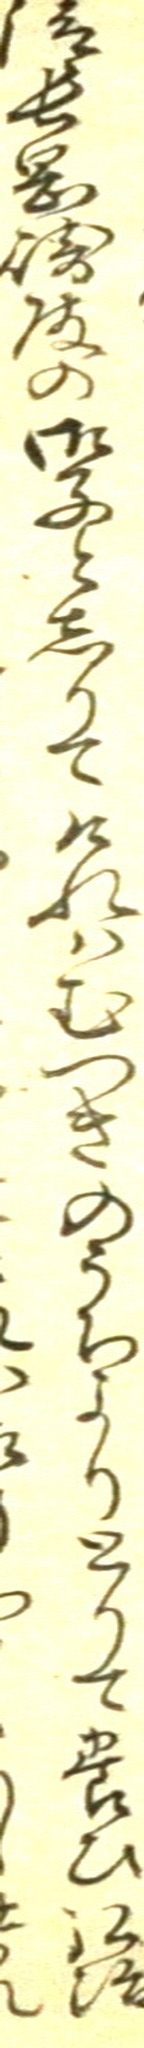清長岡崎殿の御子としりてけれはむつきのうちよりとりて養ひ弘治
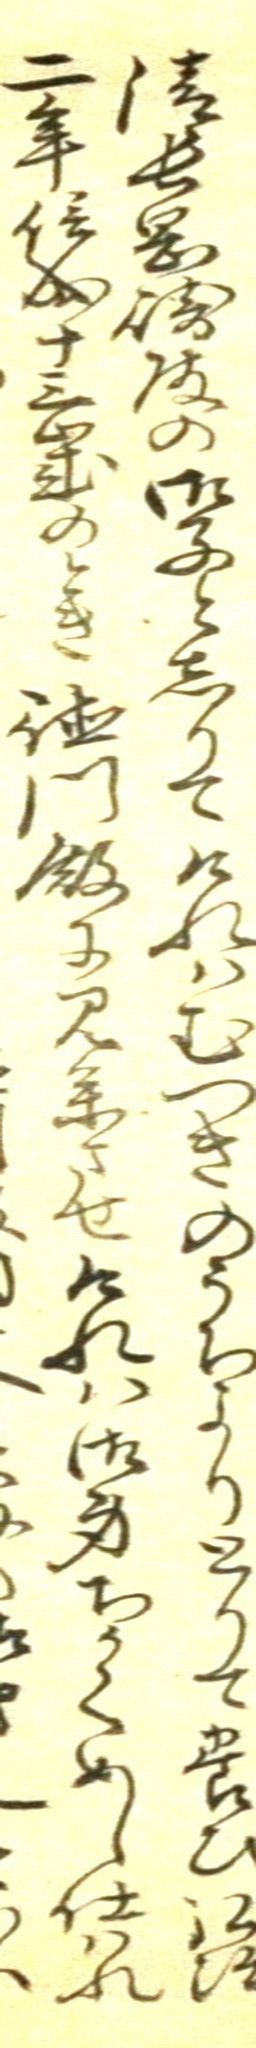二年信成十三歳のとき徳川殿に見参させけれは御身ちかくめし仕はれ
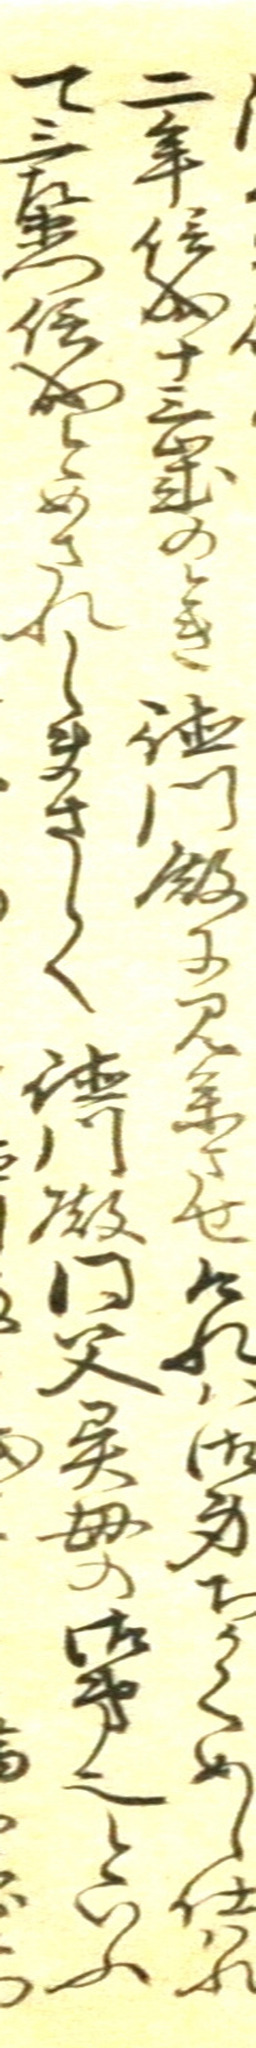て三左衛門信成とめされしまさしく徳川殿同父異母の御弟也といふ
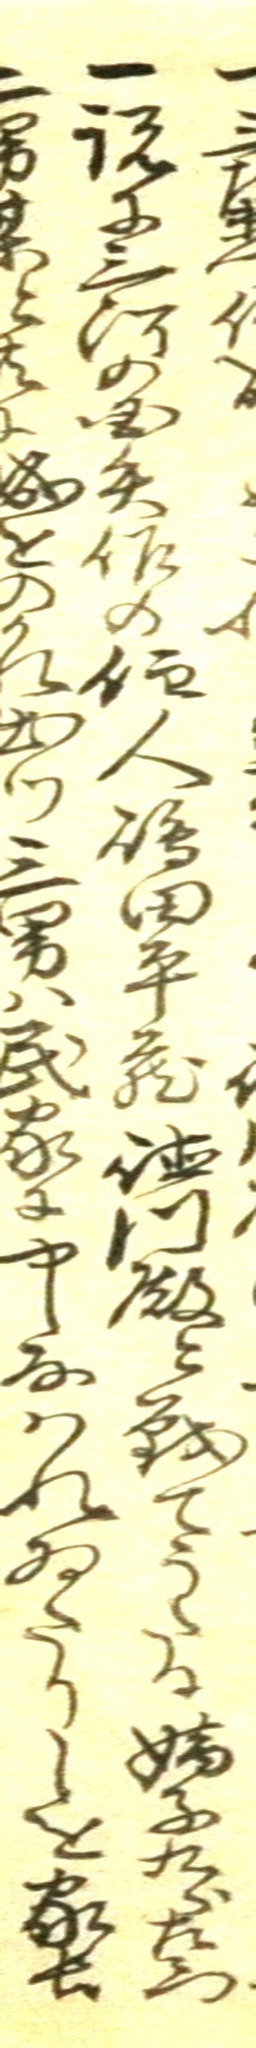二男某と共に城をのかれ出ツ三男は民家にやしなはれゐたりしを家長
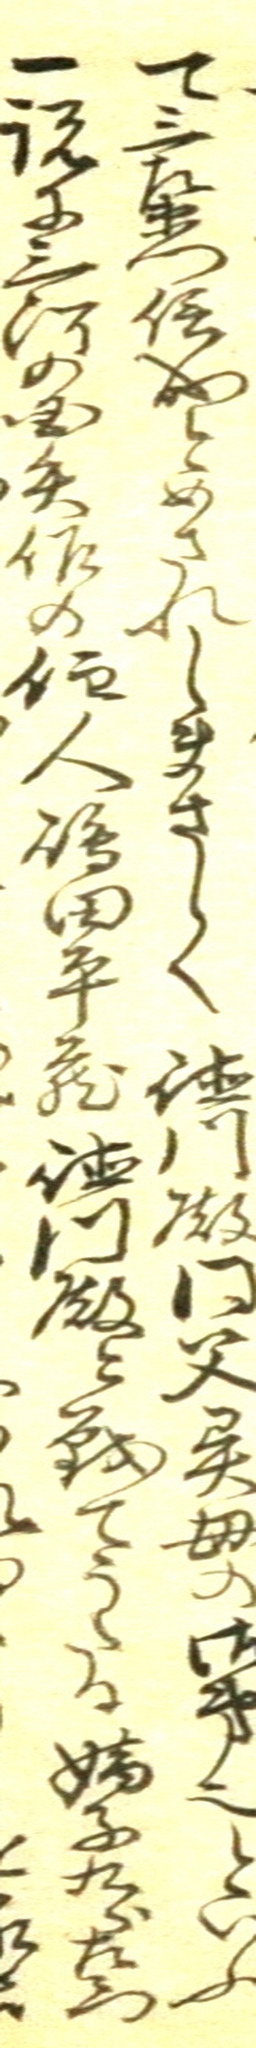一説に三河の国矢作の住人嶋田平蔵徳川殿と戦てうたる嫡子九郎左衛門
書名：藩翰譜（四・中）
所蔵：伊那市立高遠町図書館・合同会社AMANE
